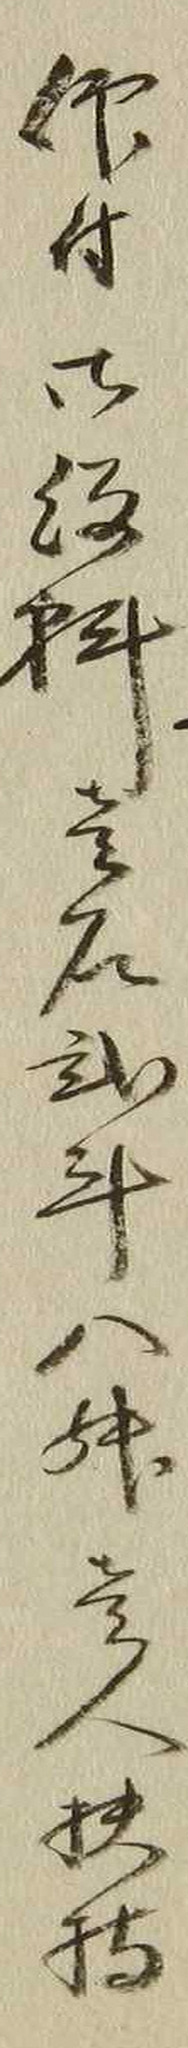仰付御役料壱石弐斗八升壱人扶持
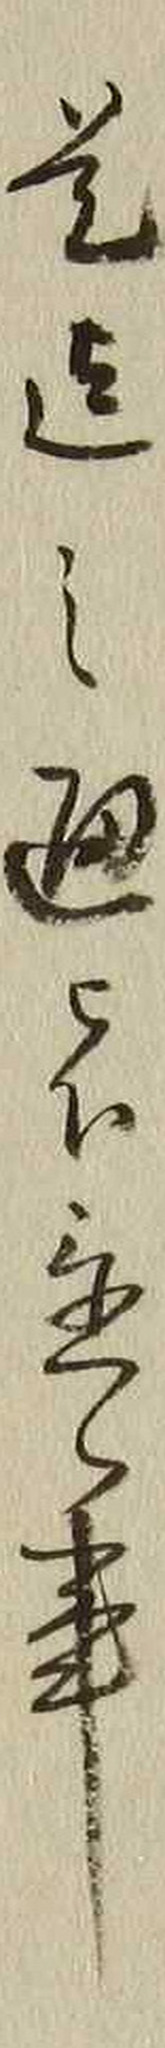是迄之通被下置候事
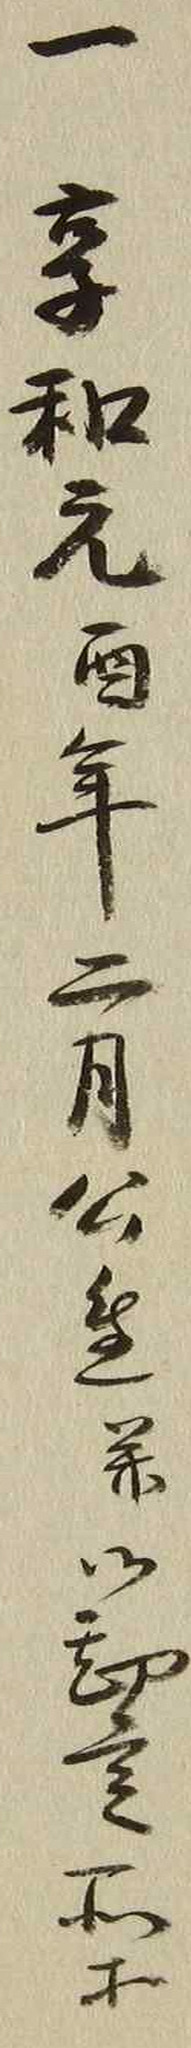一享和元酉年二月公辺并御勘定所等
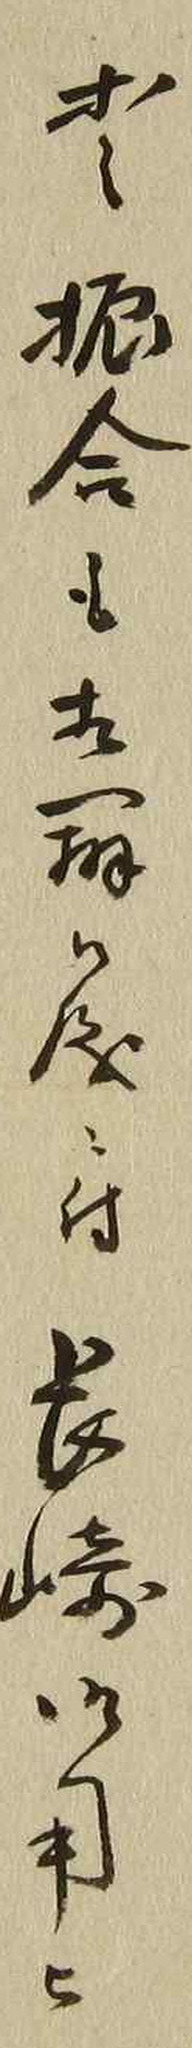等之振合も相弁候儀ニ付長崎御用被
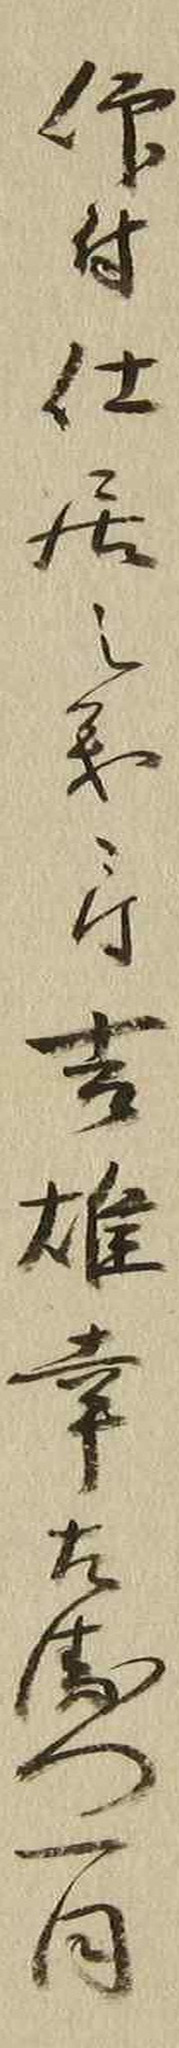仰付仕居之義ニ付吉雄幸左衛門一同
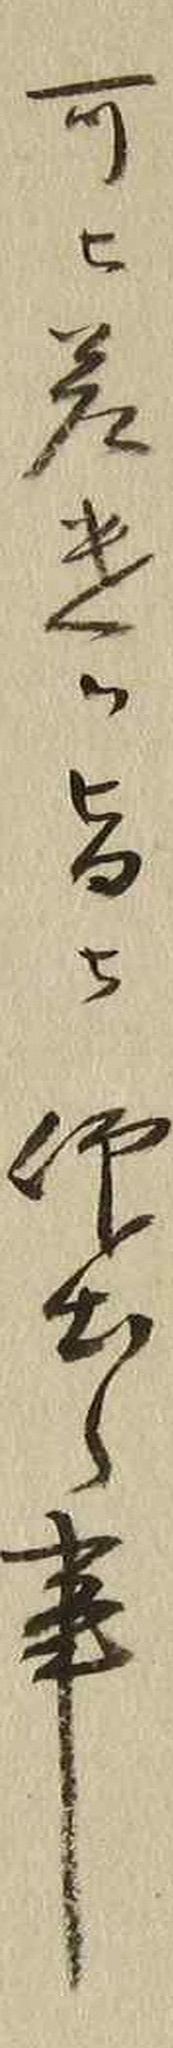可被差遣候旨被仰出候事
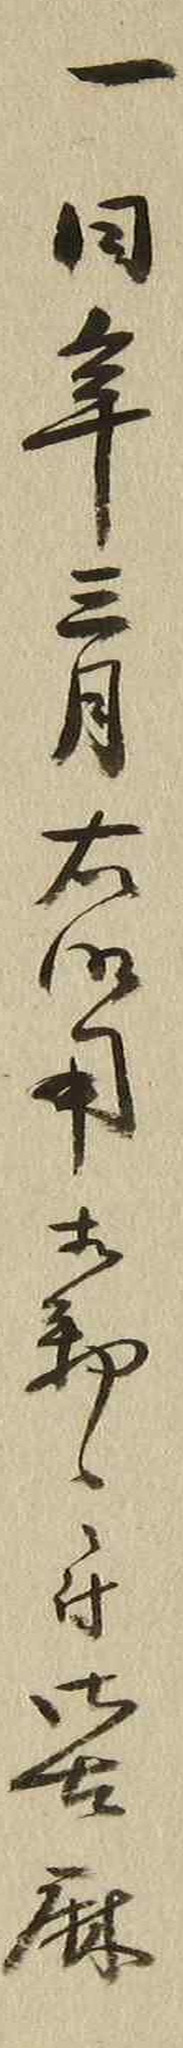一同年三月右御用相勤候ニ付御古麻
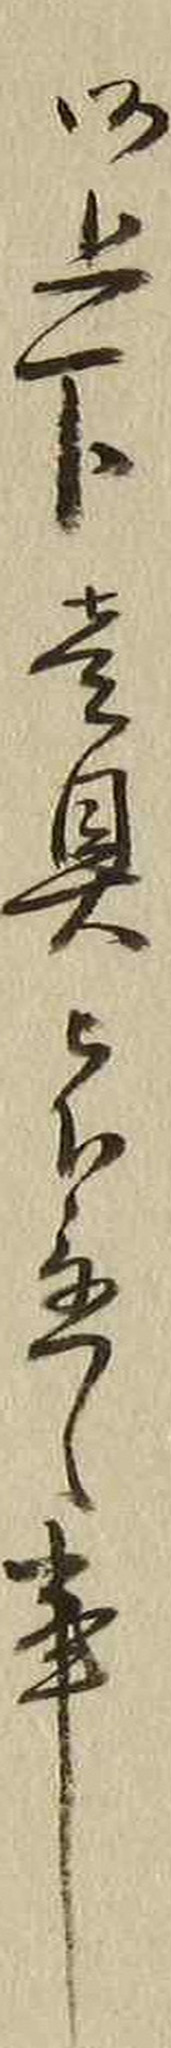御上下壱具被下置候事
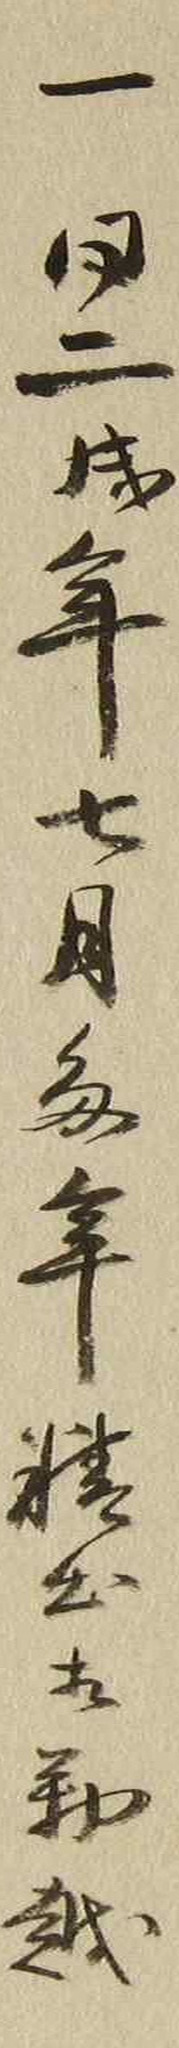一同二戌年七月多年精出相勤越
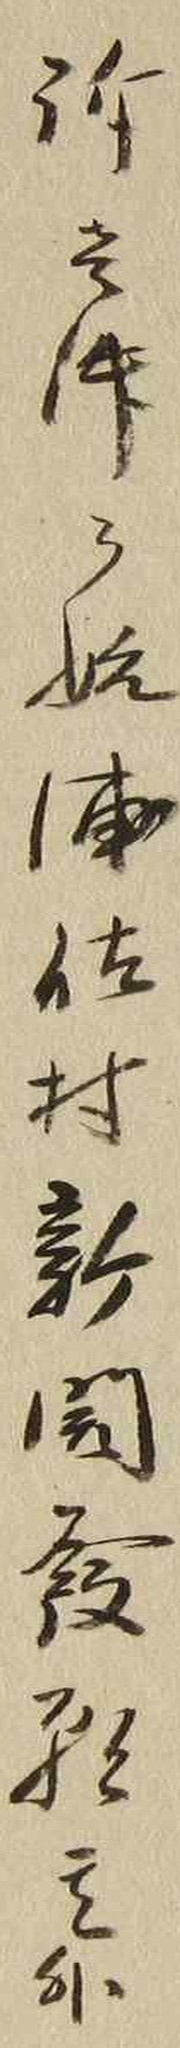訴壱件ヲ始浦佐村新開発願其外
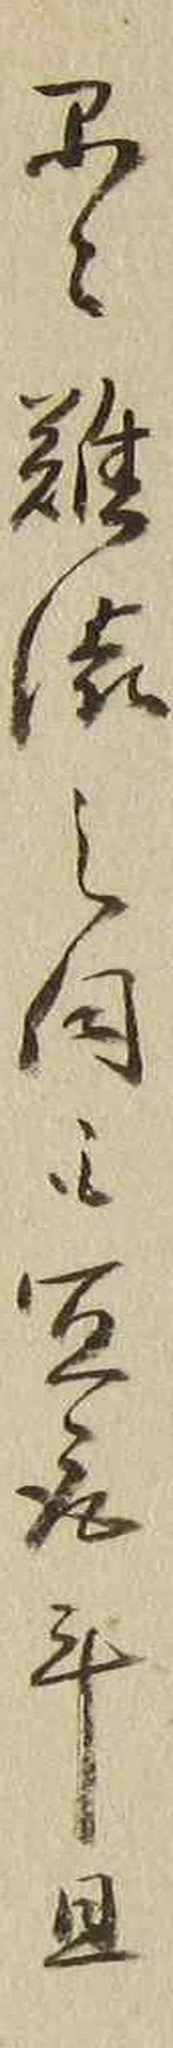品々難流之伺も宜取計且
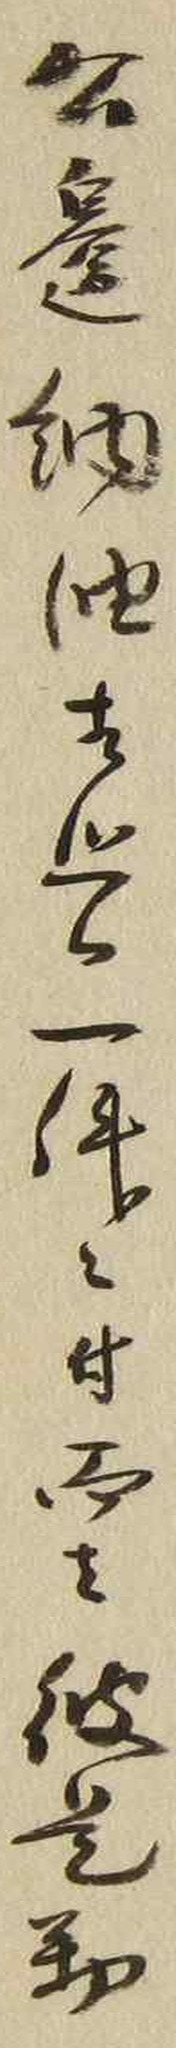公辺納油相止候一件ニ付而は彼是勤
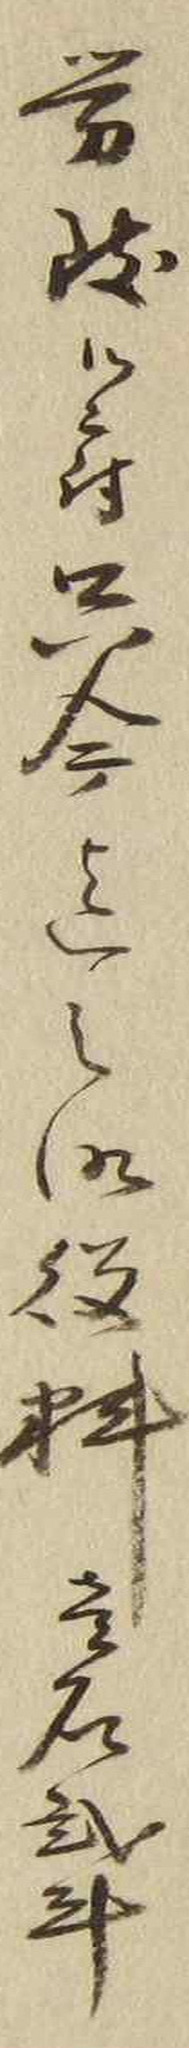労致候ニ付只今迄之御役料壱石弐斗

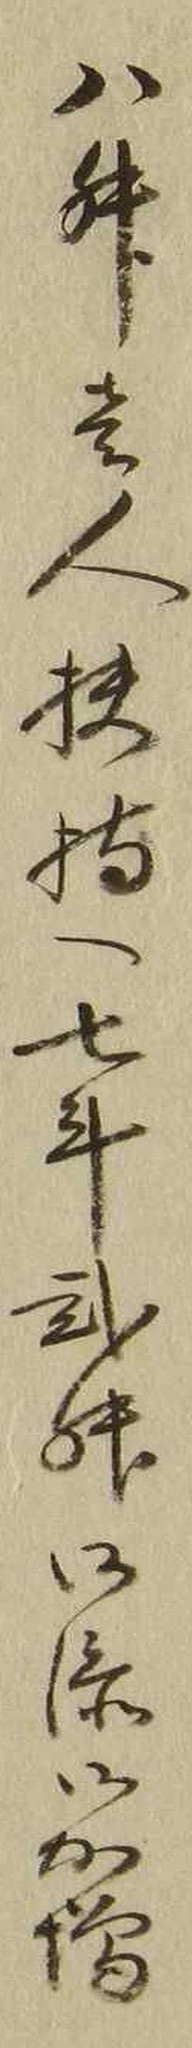八升壱人扶持へ七斗弐升御添御加増
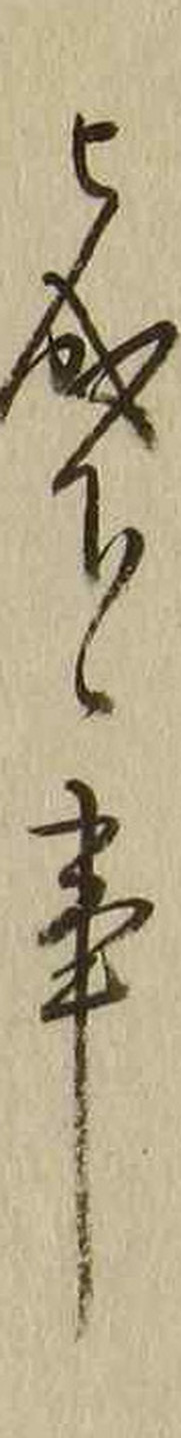被成下候事
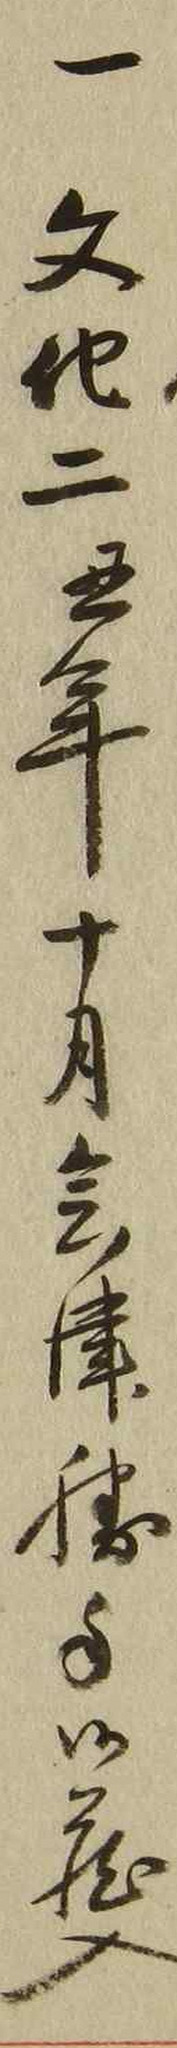一文化二丑年十月会津勝手御蔵入
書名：諸士系譜　巻之236　ふ之部4
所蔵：会津若松市立会津図書館
